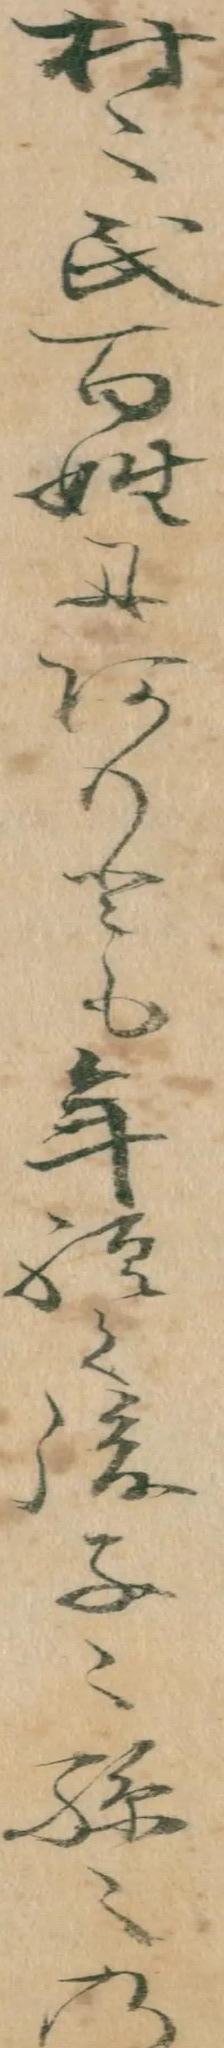村々民百姓にありとも年経て後子々孫々の
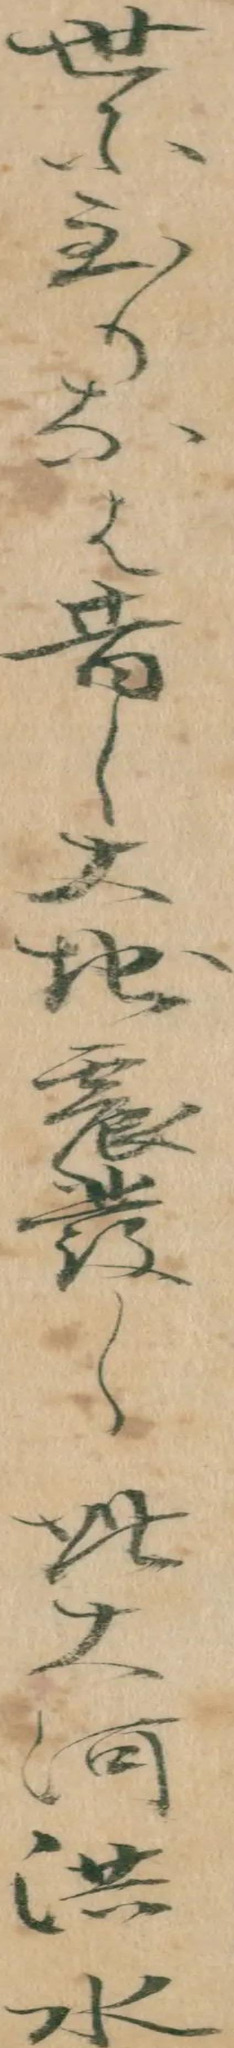世に至りなは昔し大地震發し此大河洪水
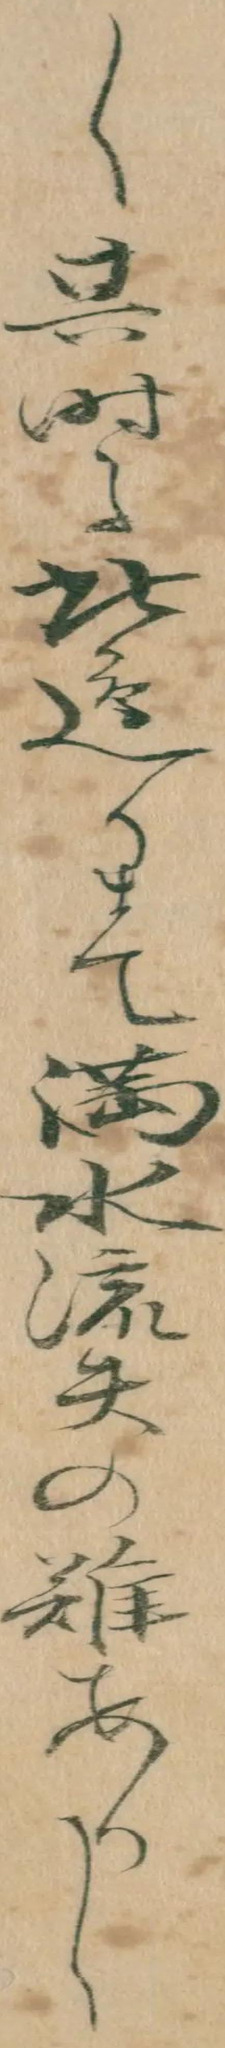し其時に此邊りまて満水流失の難ありし
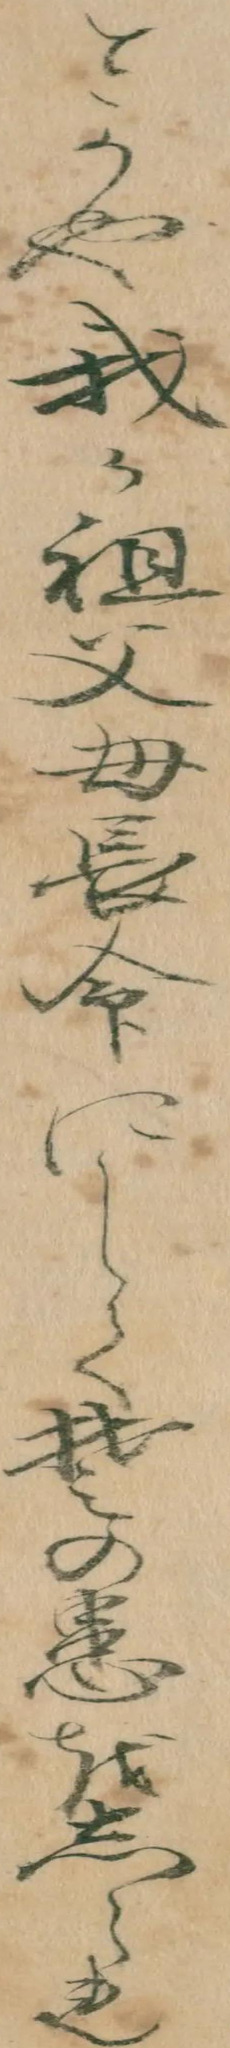とかや我々祖父母長命にしてその患をしられ
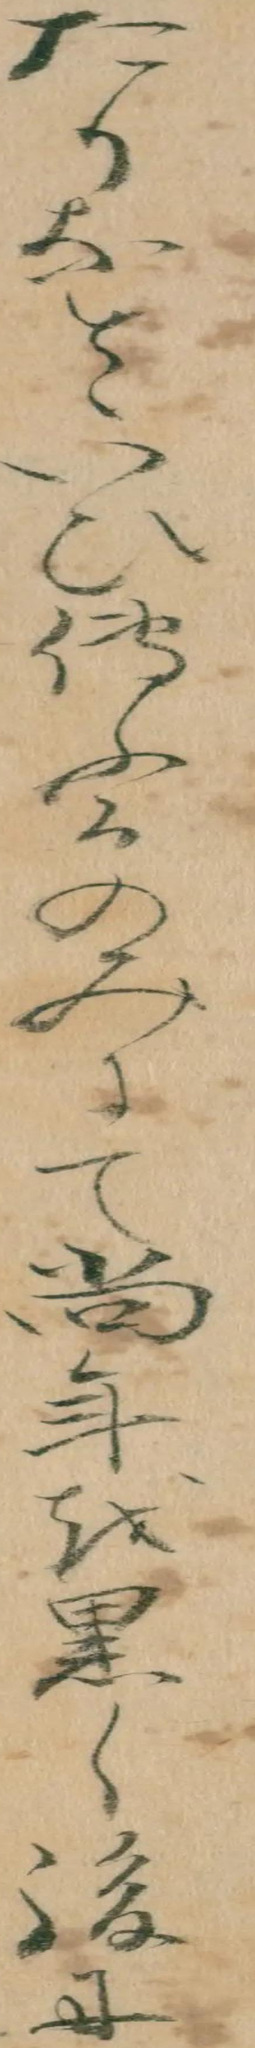たりなとゝいひ傳ふかのみにて尚年を累し後に
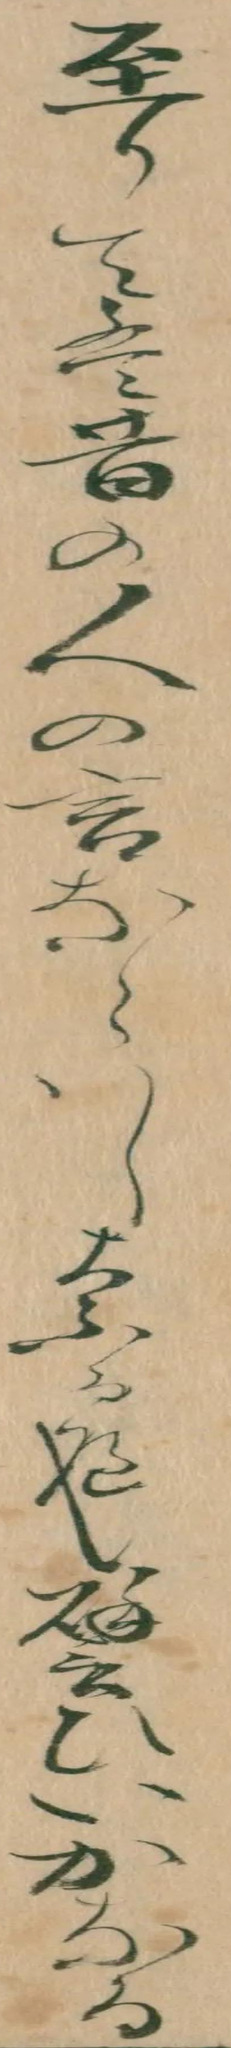至りては昔の人の言なといゝなるへし譬ひいかなる
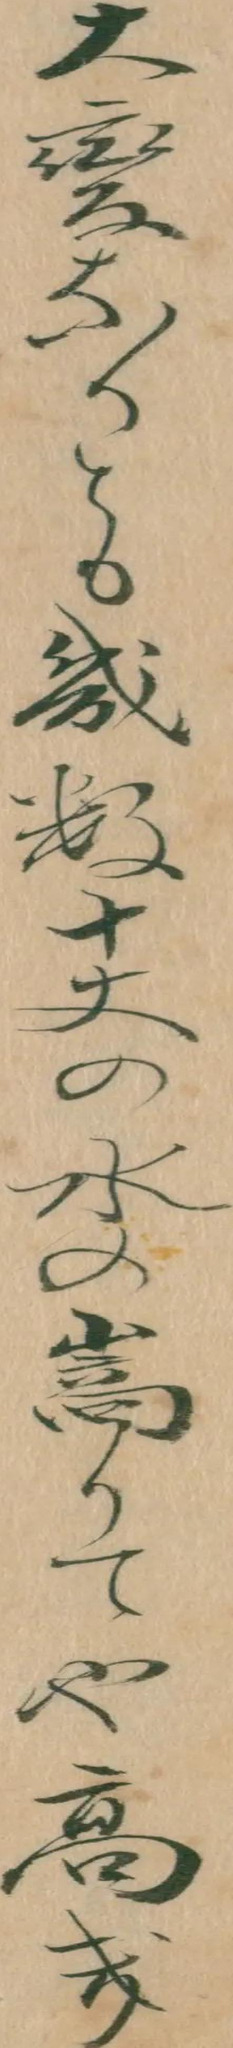大変なりとも幾数十丈の水の嵩りてや高き
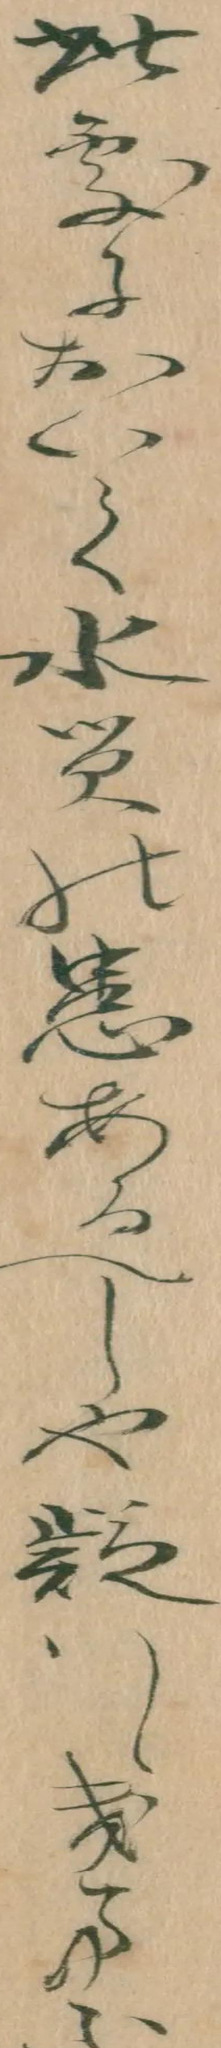此處において水災の患あるへしや疑はしき事に
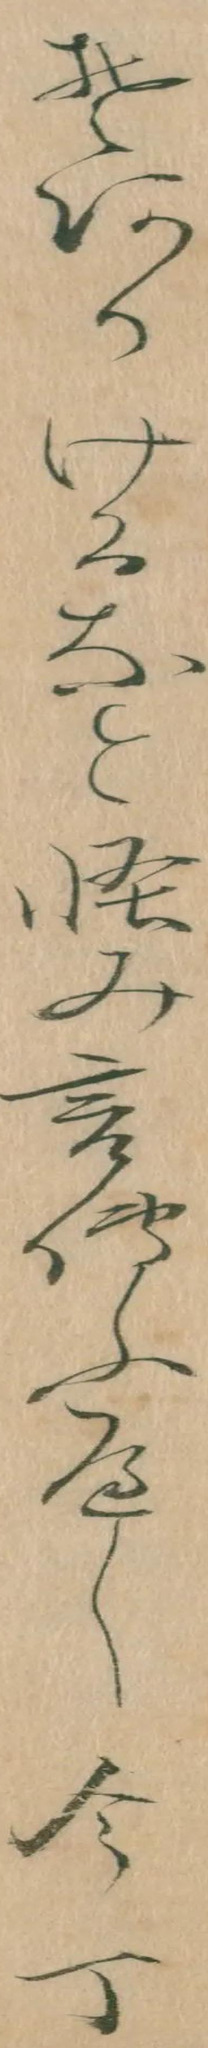そありけるなと怪みいい言傳ふへし今丁
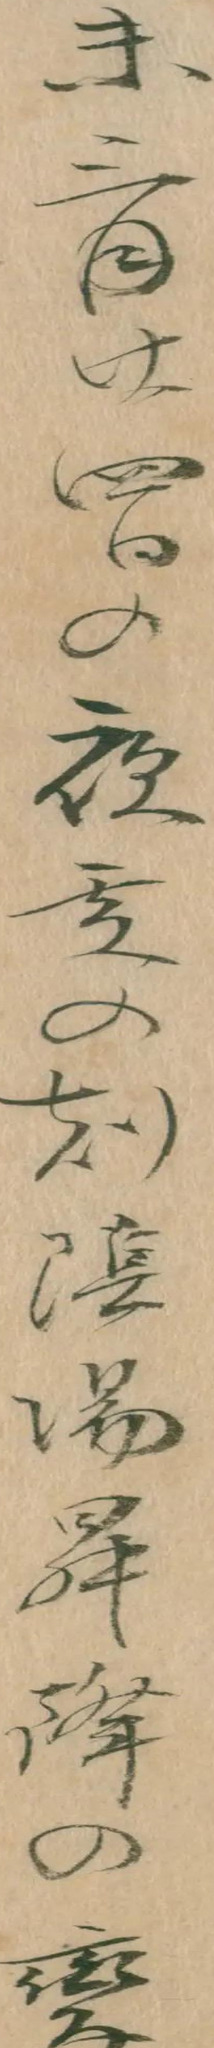未三月は四日の夜亥の刻陰陽昇降の變
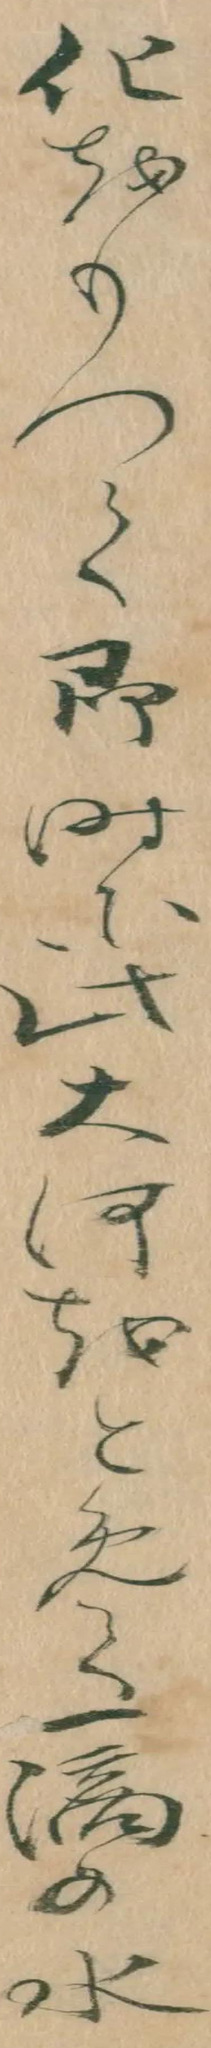化をもつて即時に此大河をとめて一滴の水
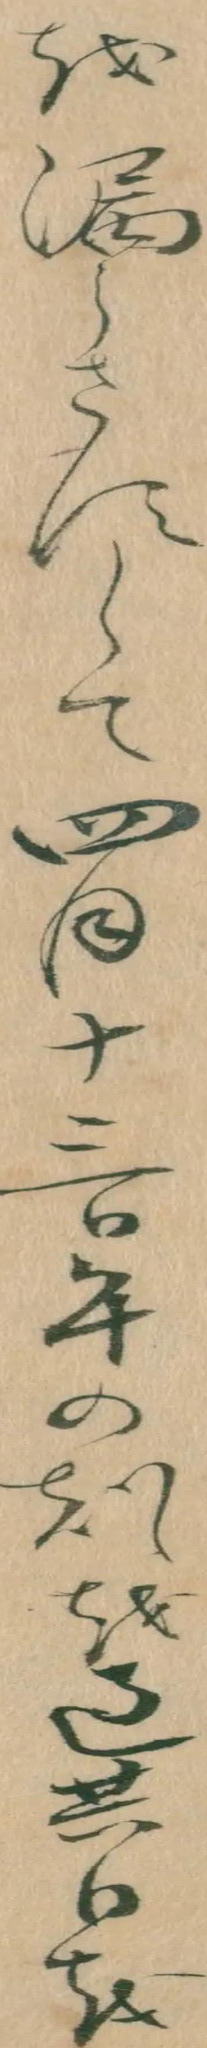を漏らさすして四月十三日午の刻を過共日を
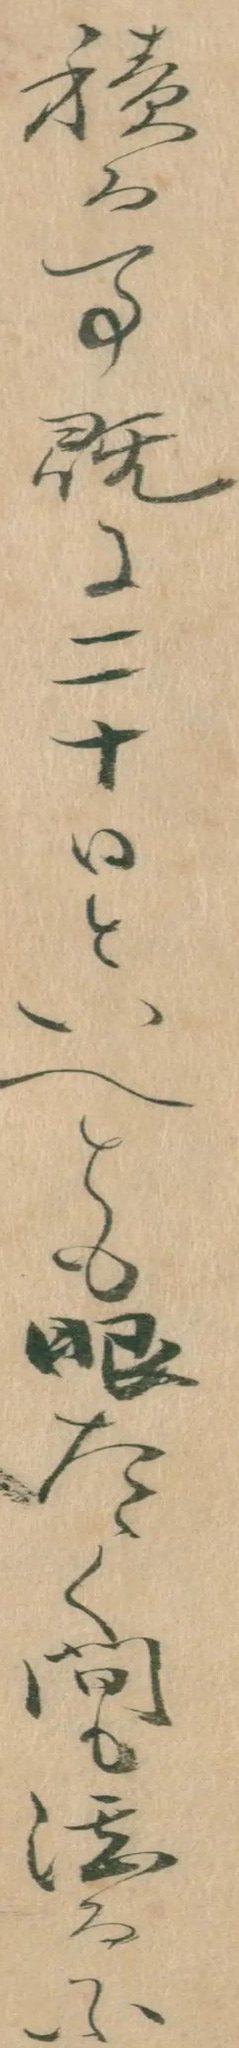積る事既に二十日といへとも眼たゝく間も湛るに
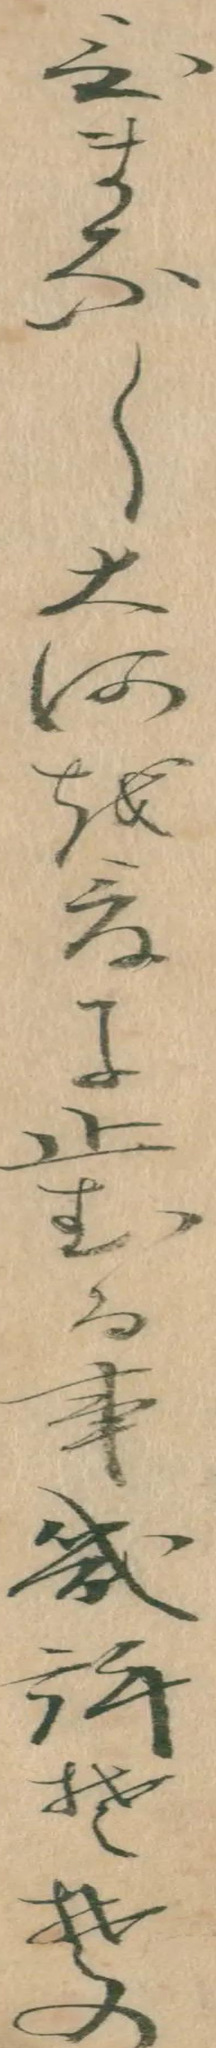ひまなし大河を爰に止むる事幾許そその
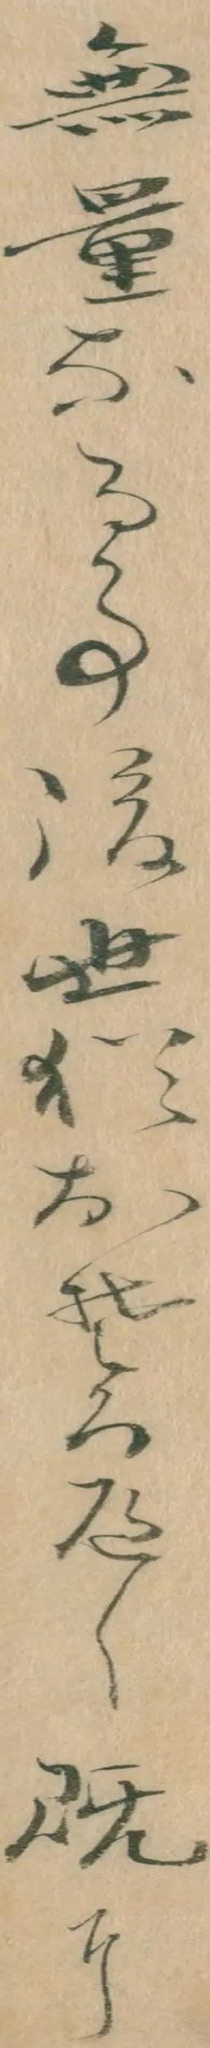無量なる事後世猶おそるへし既に

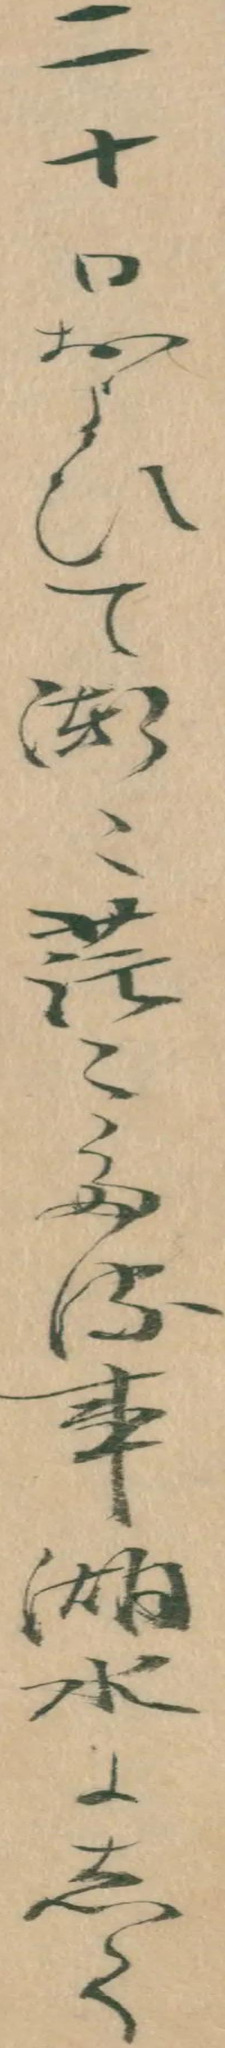二十日およひて漸々茫々たる事湖水にして
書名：俗語之種. [7]
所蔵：国立国会図書館 National Diet Library, JAPAN
